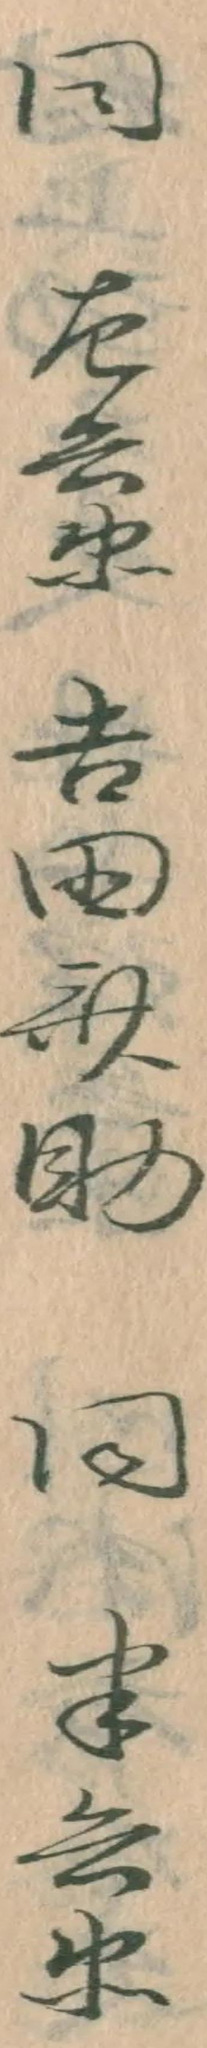同左兵衛吉田斉助同半兵衛
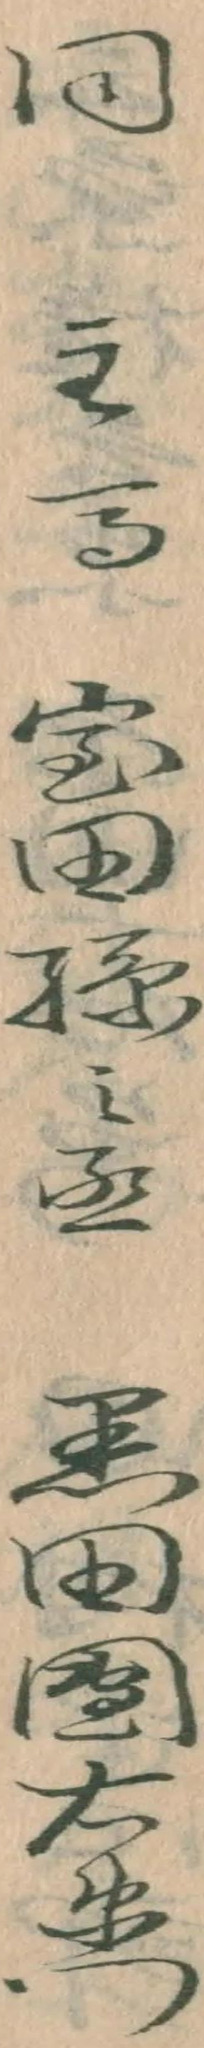同主馬宝田孫之丞黒田團右衛門
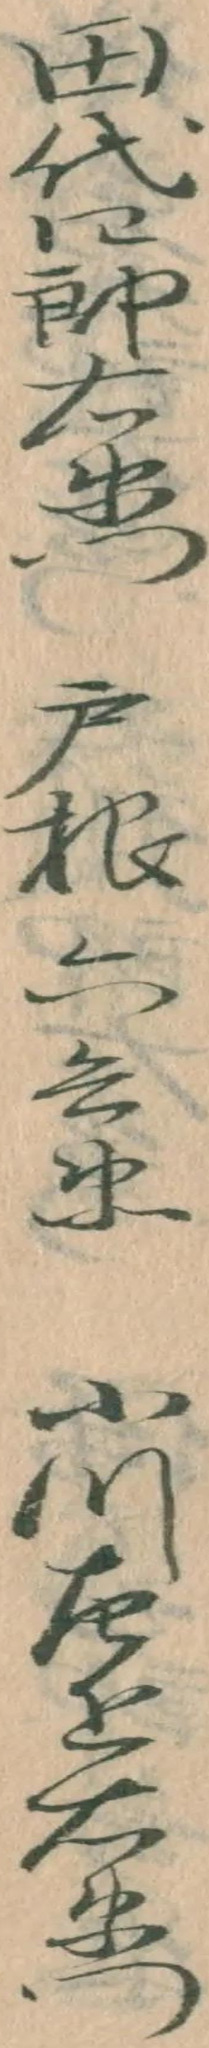田代四郎右衛門戸根六兵衛小川左近右衛門
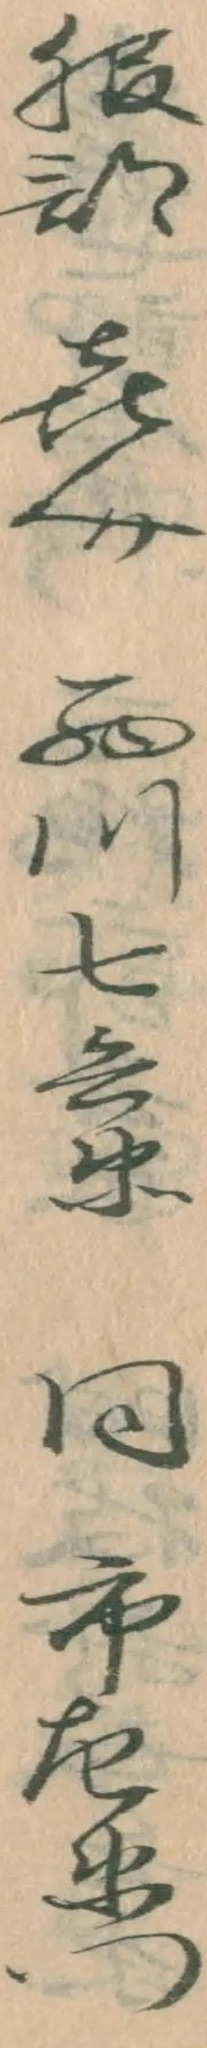服部喜介西川七兵衛同市左衛門

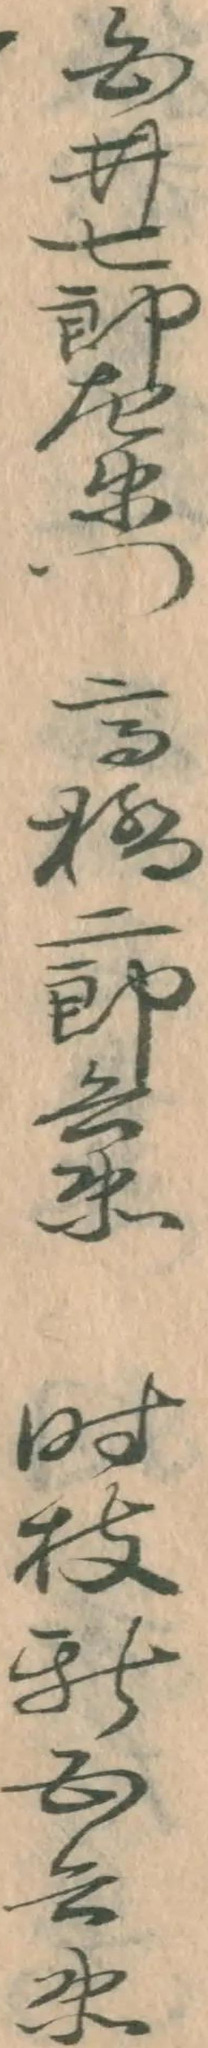白井七郎左衛門高橋二郎兵衛時枝新五兵衛
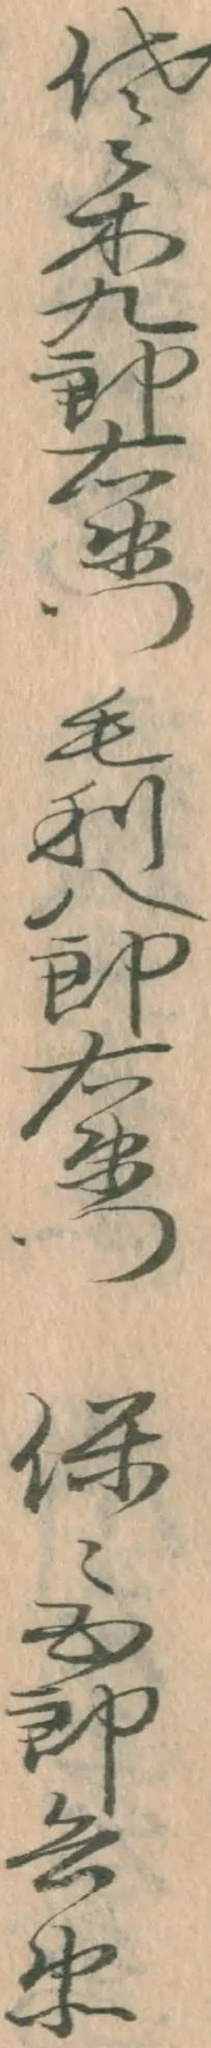佐々木九郎右衛門毛利八郎右衛門保々五郎兵衛
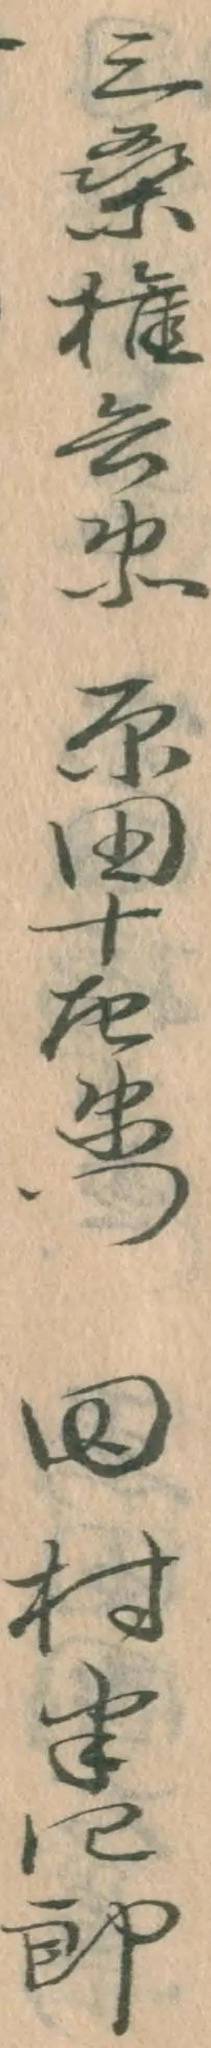三桑権兵衛原田十左衛門田村半四郎
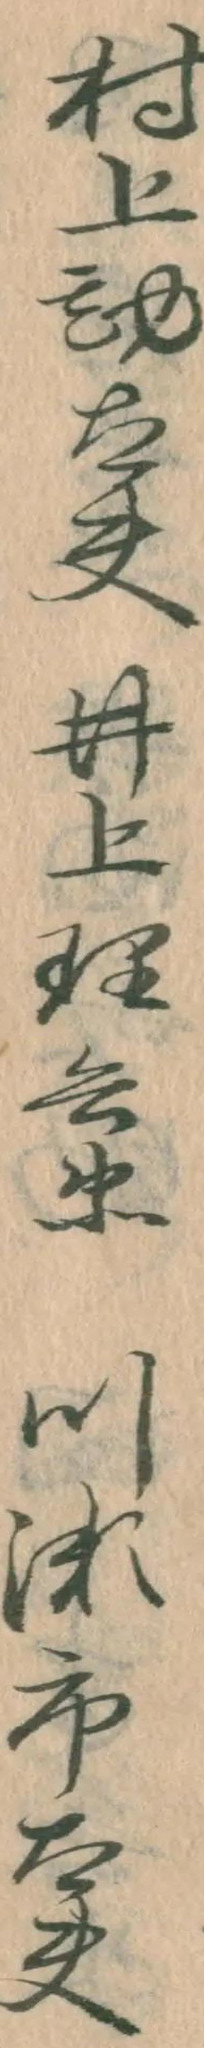村上勘太夫井上理兵衛川瀬市太夫
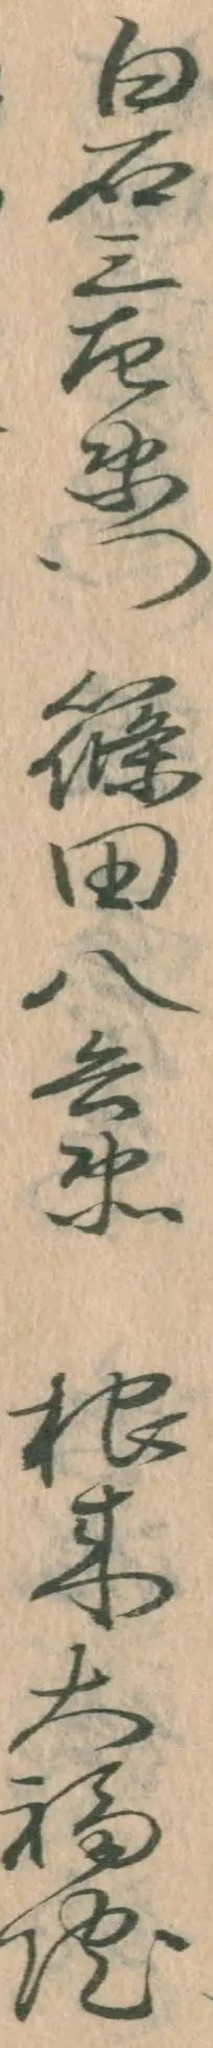白石三左衛門篠田八兵衛根来大福院
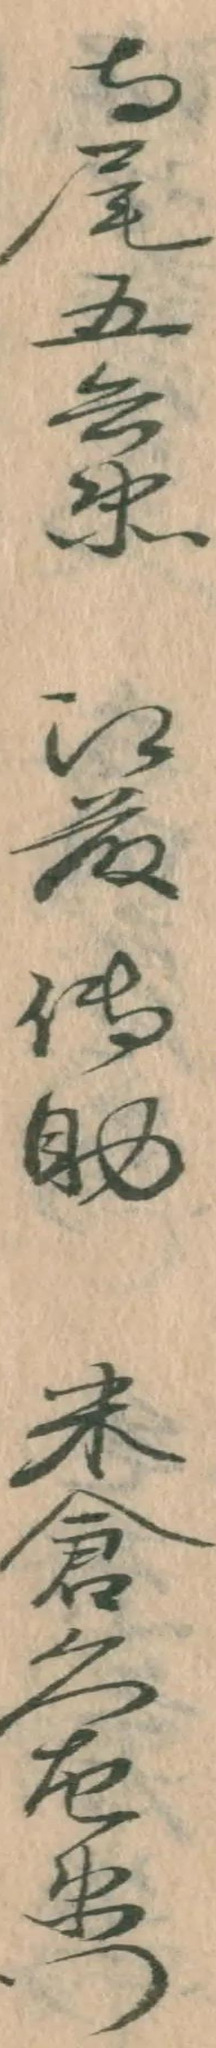寺尾五兵衛江藤伝助米倉久左衛門
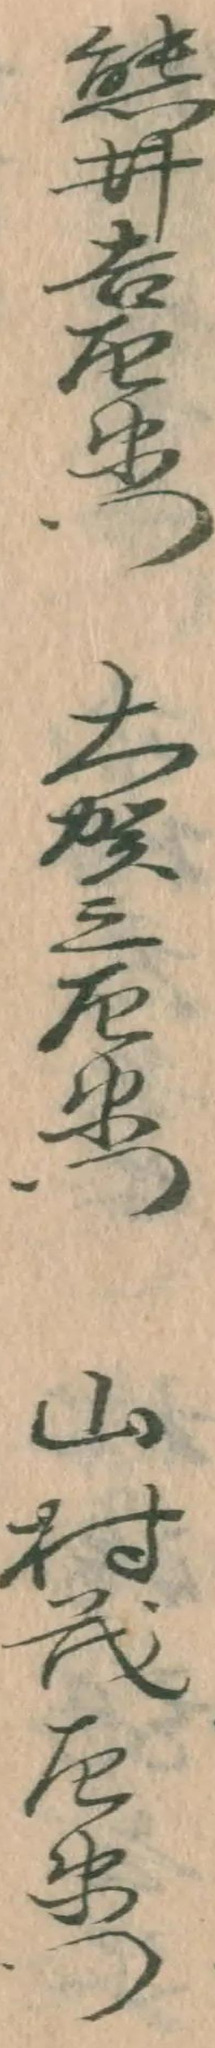熊井吉左衛門大賀三左衛門山村茂左衛門
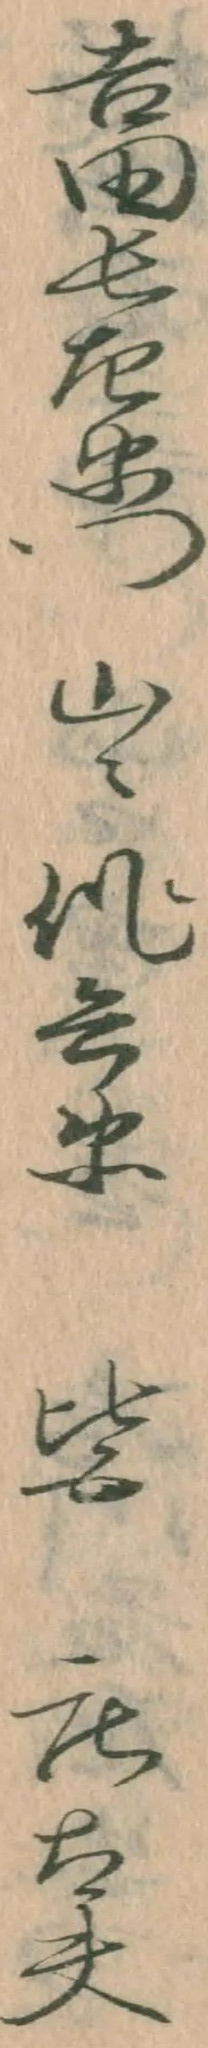吉田長左衛門山々作兵衛皆庄太夫
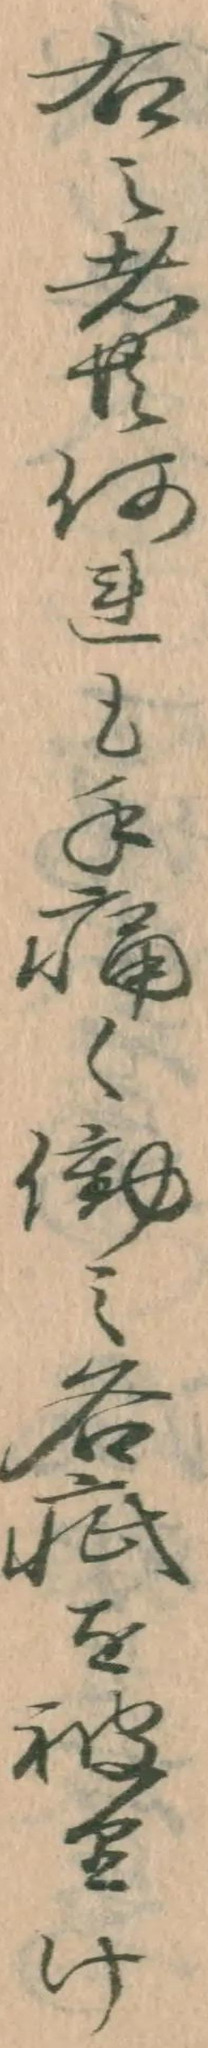右之者共何連も手痛く働之各疵を被里け
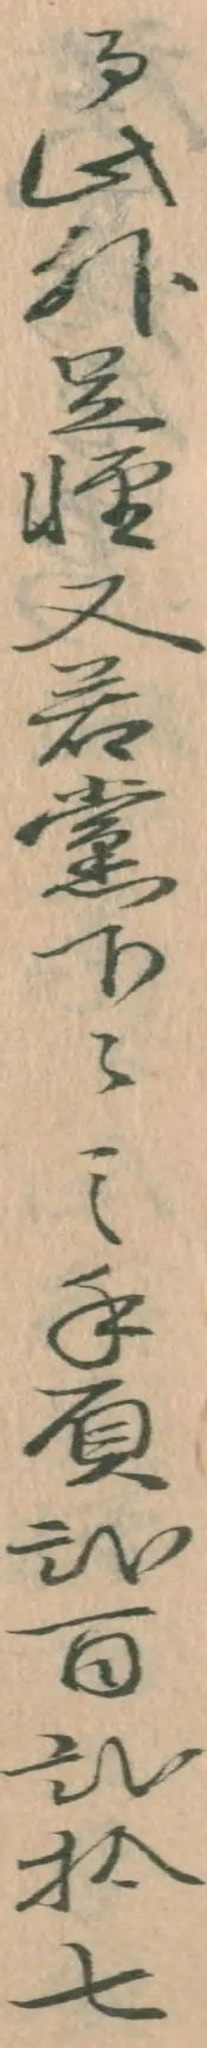る此外足軽又若党下々之手負弐百弐拾七
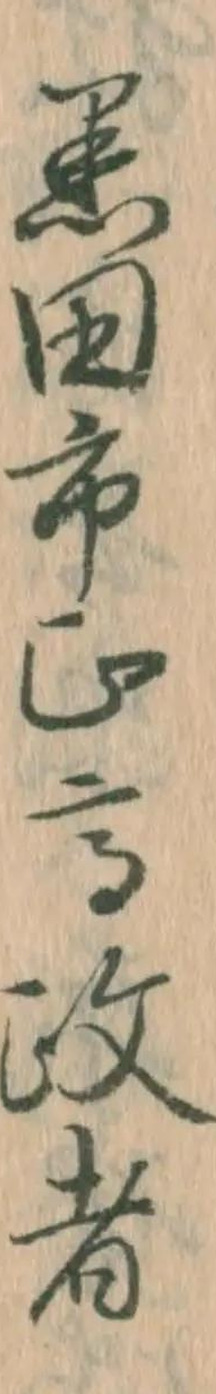黒田市正高政
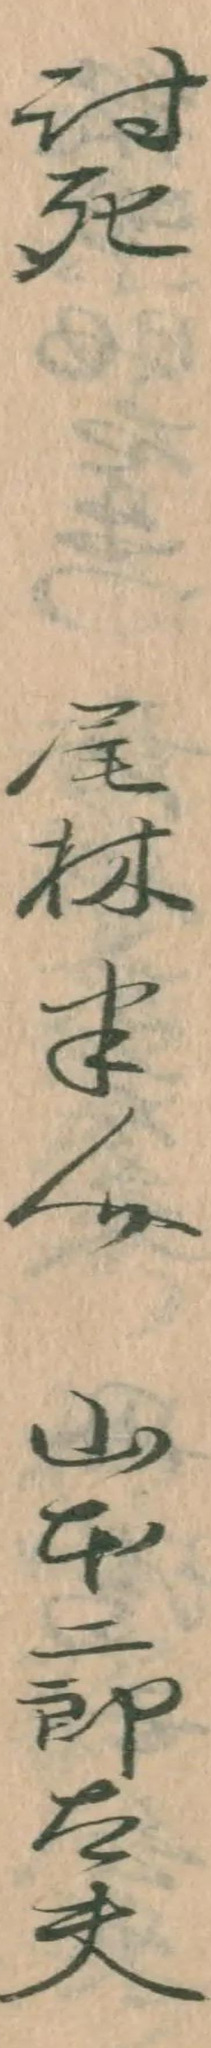討死尾林半介山本二郎太夫
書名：切支丹御退治記 49巻. [9]
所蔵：国立国会図書館 National Diet Library, JAPAN
